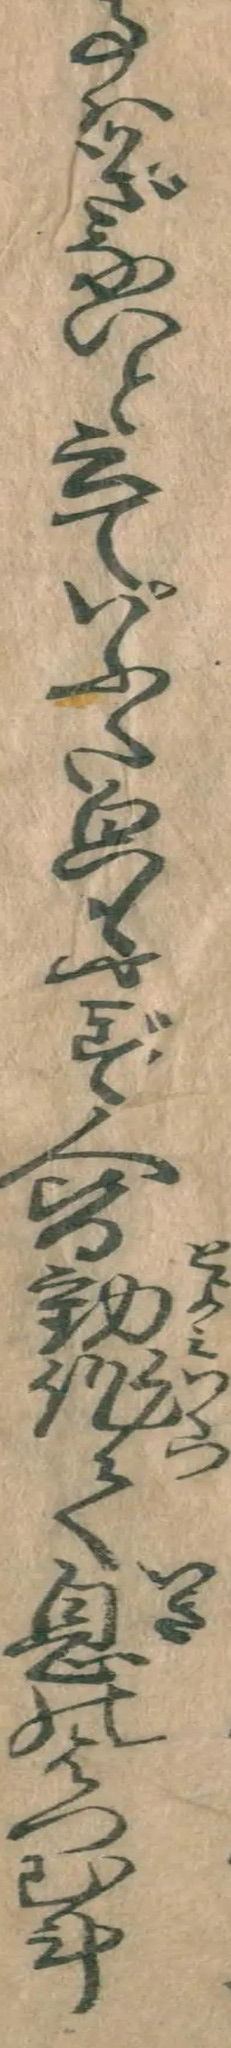事は御ざないと云て。いふた貌もせず人皆動作て息のはつむ計
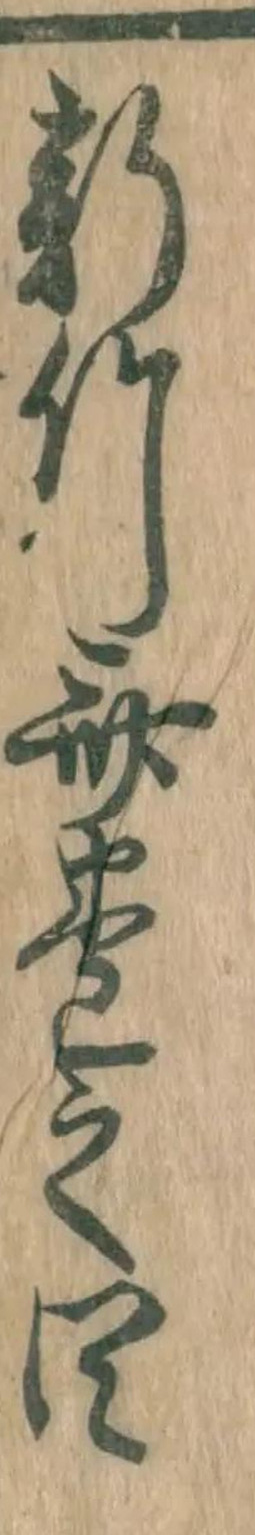新竹斎巻之四

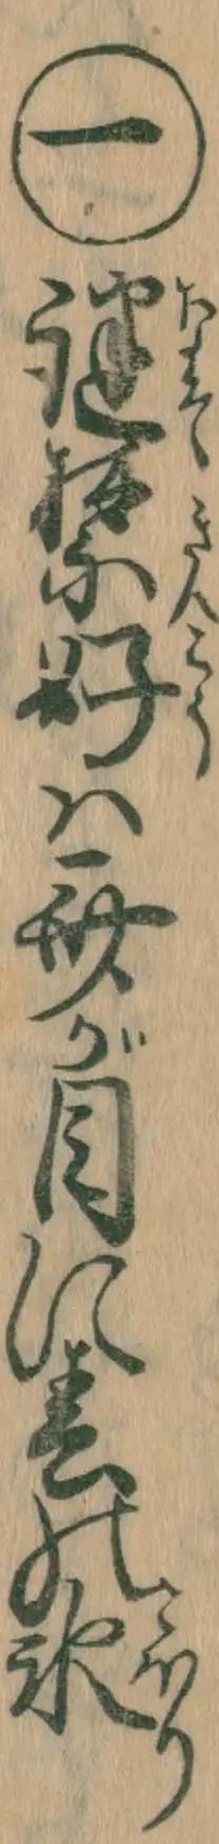一謎禁好は斎が目に春の氷
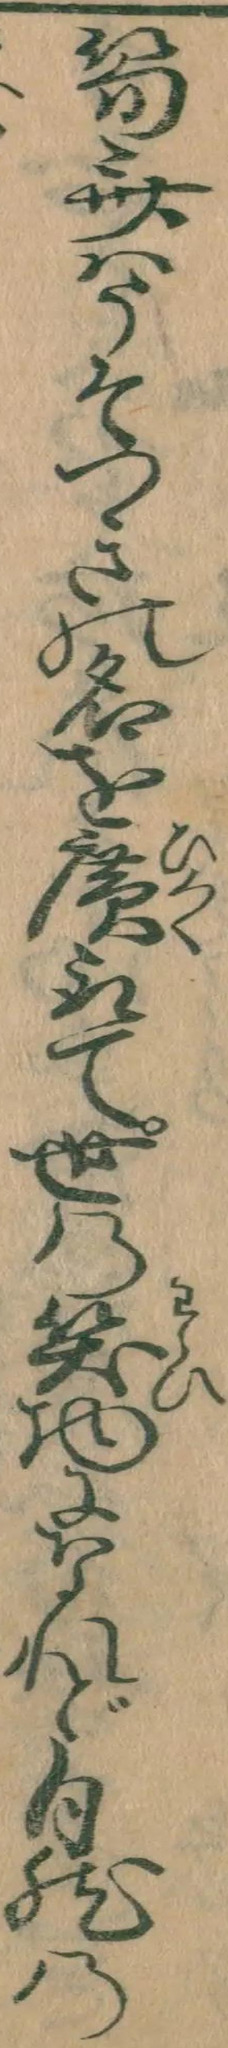筍斎はうそつきの名を広取て。世の笑物になれど自然の
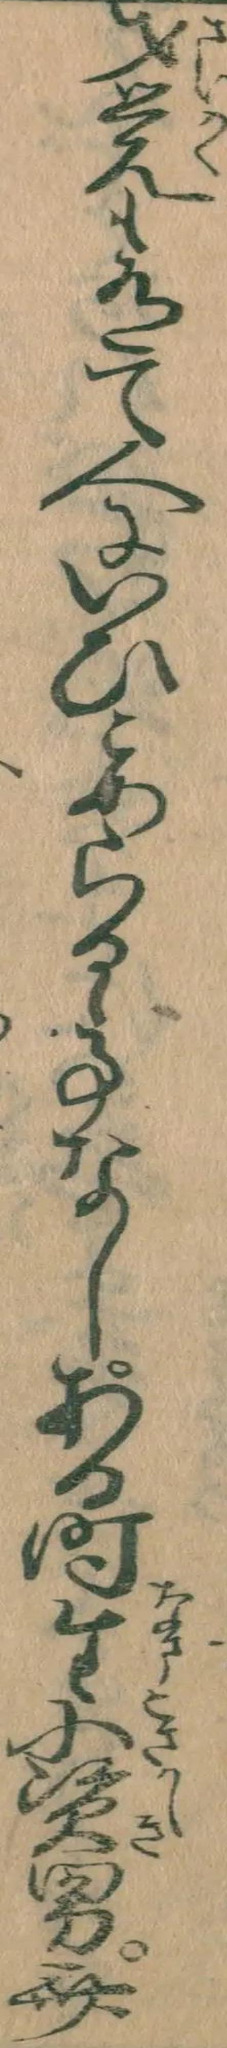才覚も有て人にいひこめらるゝ事なし。ある時生小賢男。斎
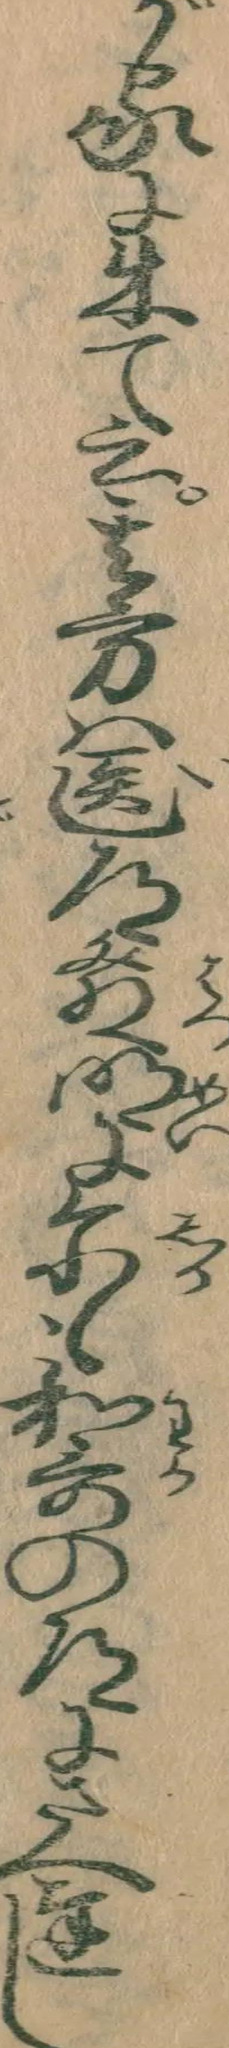が家に来て云。其方は医道発明に而も和歌の道にさへ達し
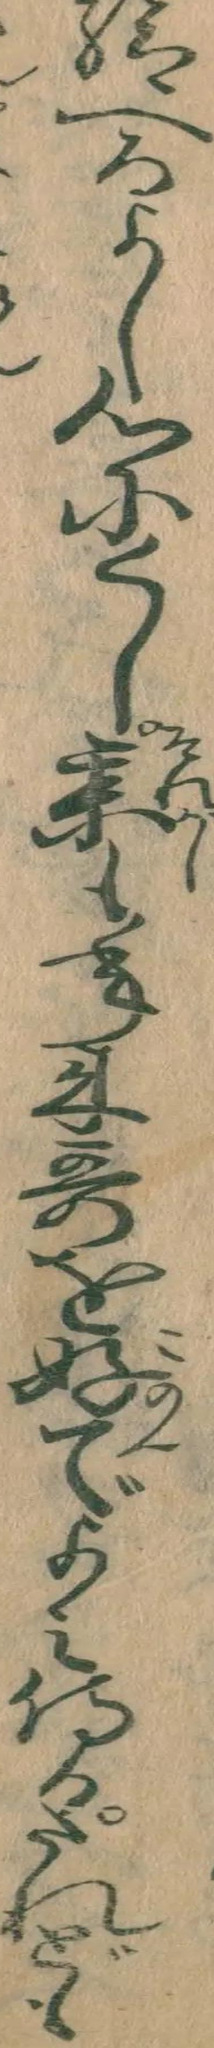給へるよし心にくし。某も年来歌を好でよみ侍る。されども
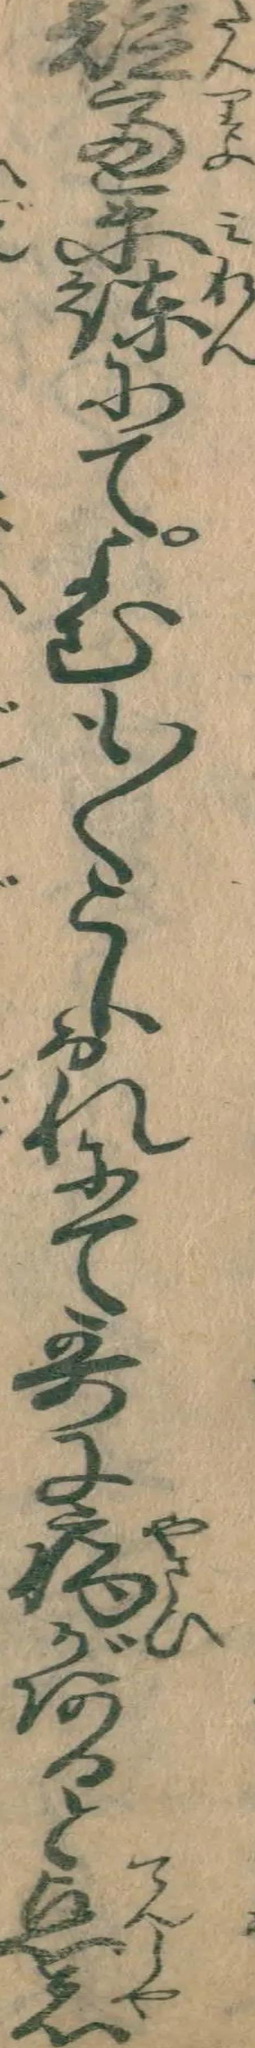短慮未練にて。よむも〳〵こしおれにて歌に病があると点者
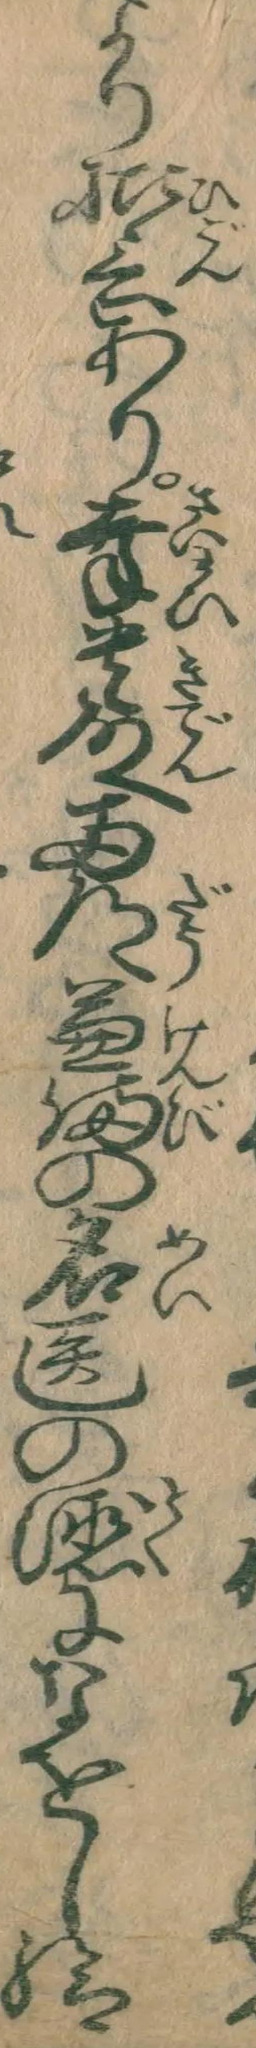より批言あり。幸貴殿両道兼備の名医の徳になをし給
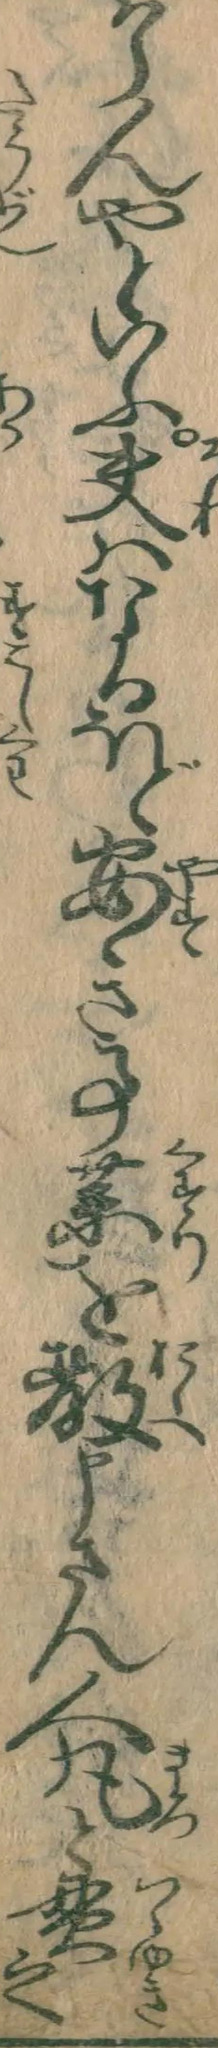はらんやといふ。夫はなるほど安き事薬を教申さん人丸と貫之
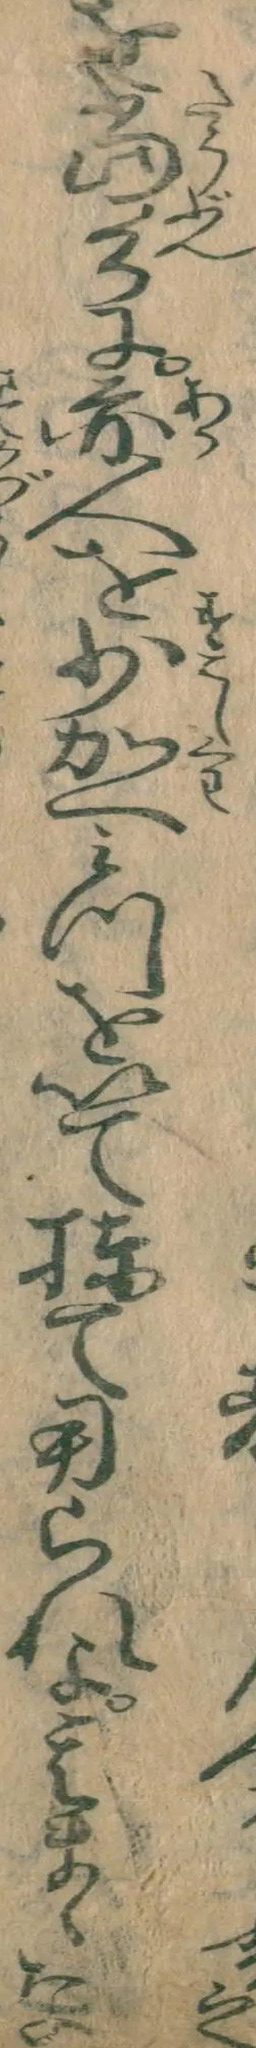を当分に。赤人を少加へみつを以て練て用られよ。其まゝな
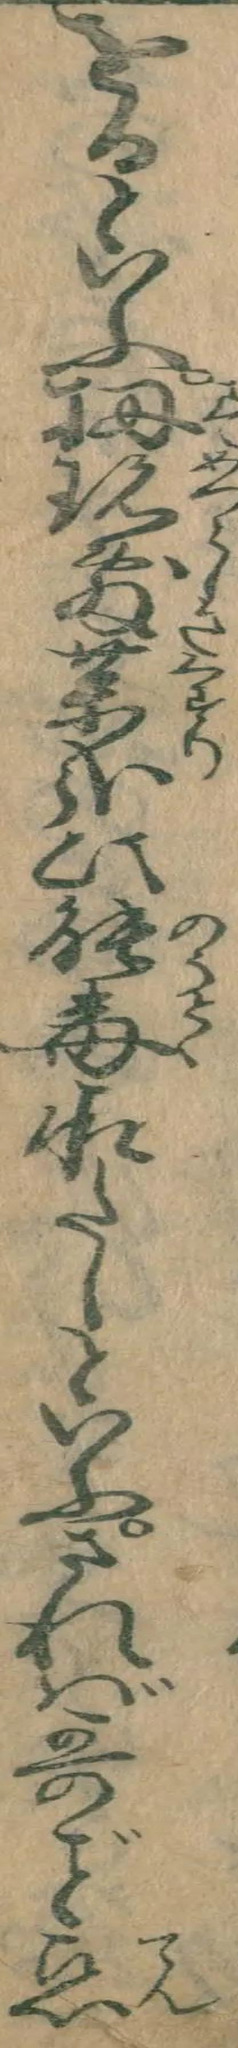をるといふ。扨珍敷薬哉此能毒承たしといふ。されば歌ごと点

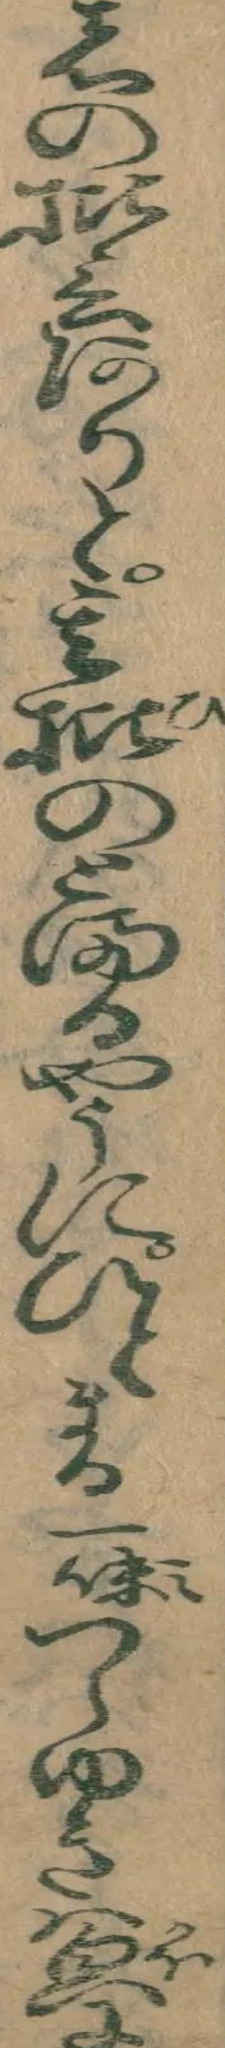者の批言ありと。其批のとまるやうに。ひとまる一味つらゆきは貌に
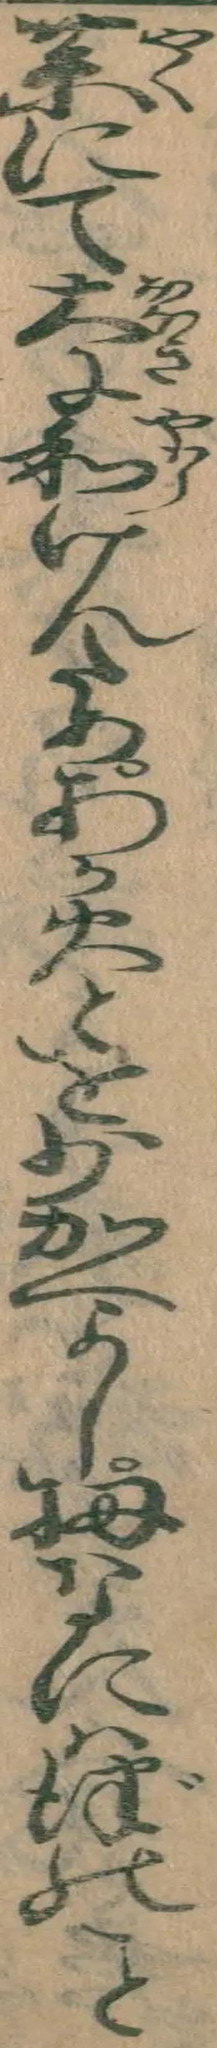薬にて大に和けんため。あか火とを少加へよし。扨なにはづのこと
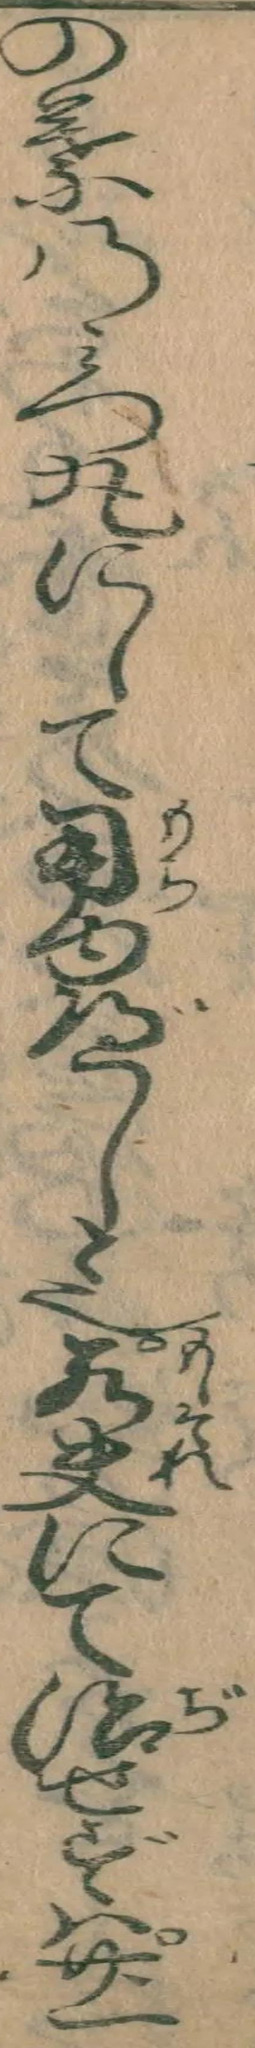の葉のみつ丸にして用ゆべしと也。若夫にて治せずは。廿一
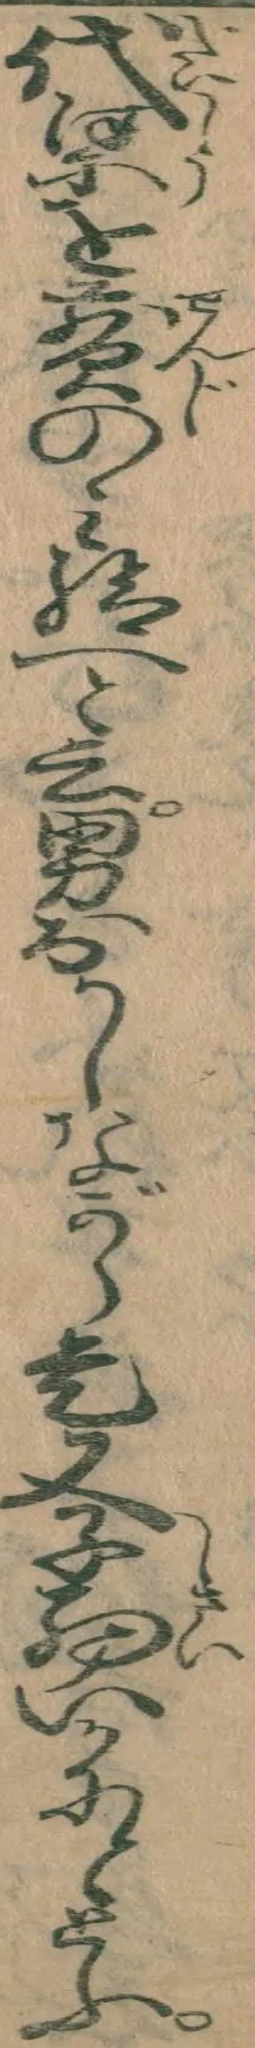代集を煎のみ給へと云。男おかしながら是又子細いかにととふ。
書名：新竹斎 5巻
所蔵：国立国会図書館 National Diet Library, JAPAN
